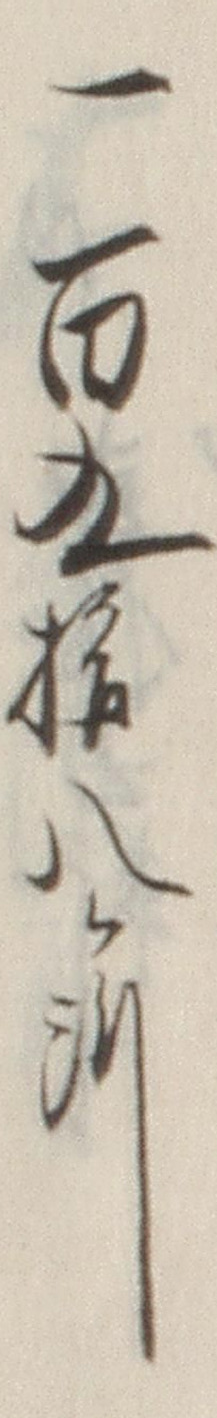百九拾八ケ所

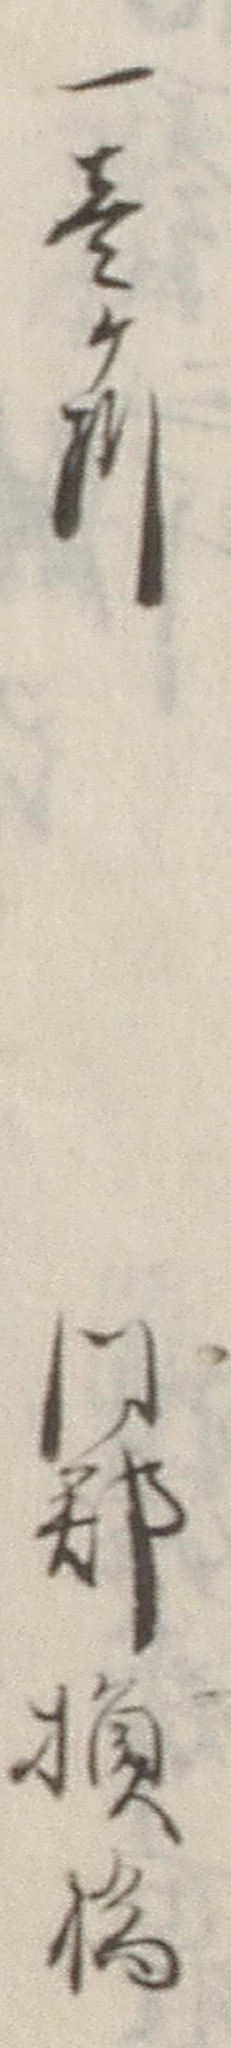一壱ケ所同郡損橋
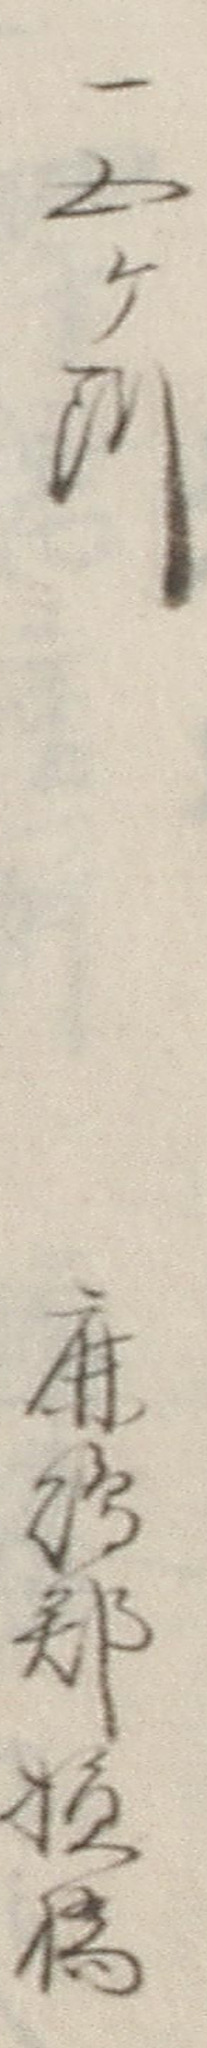一五ケ所鹿嶋郡損橋
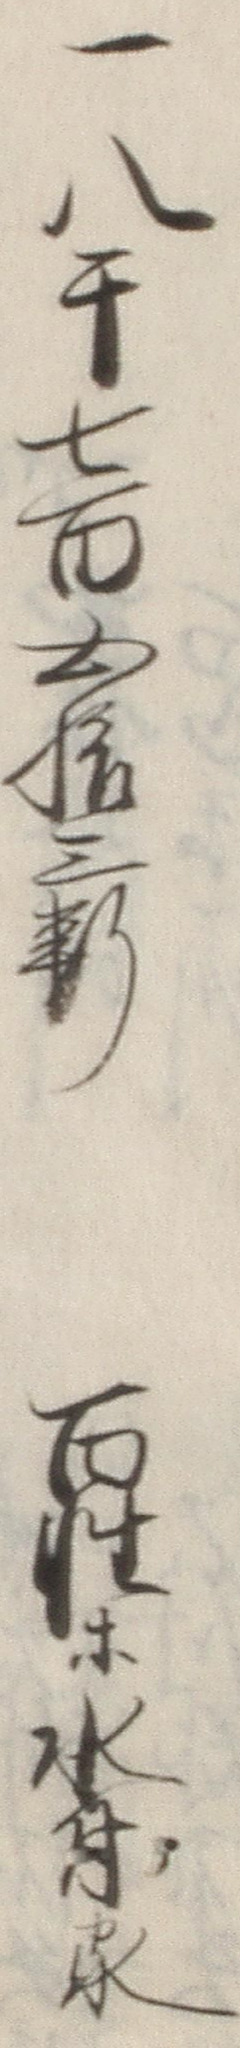一八千七百五拾三軒百姓等水付家
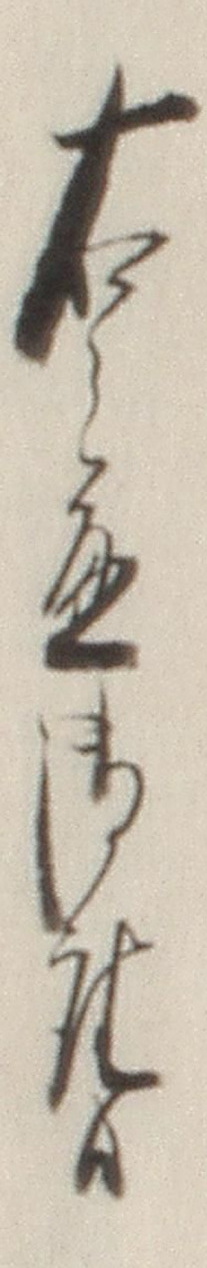右之通御座候
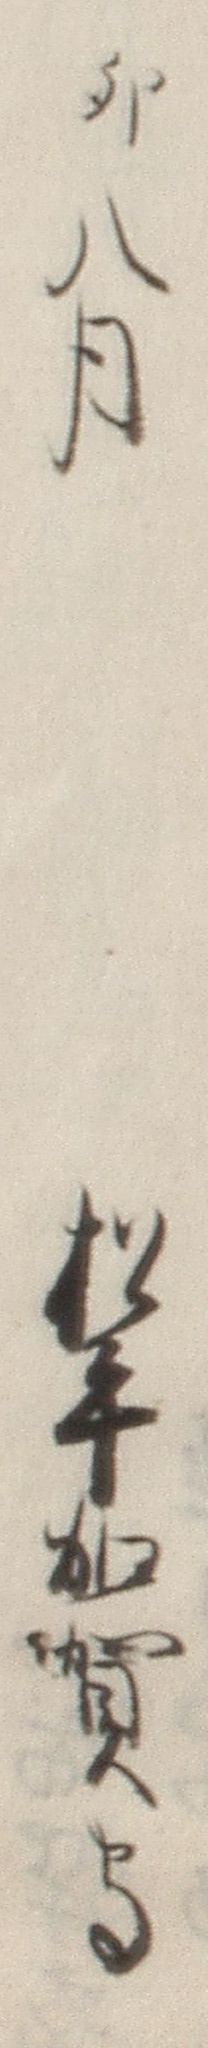卯八月松平加賀守
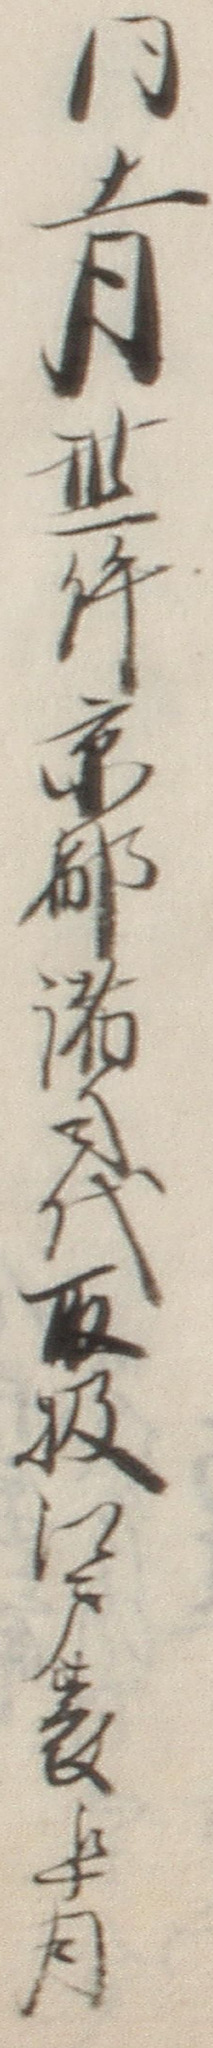同十一月此一件京都所司代取扱江戸表え十月
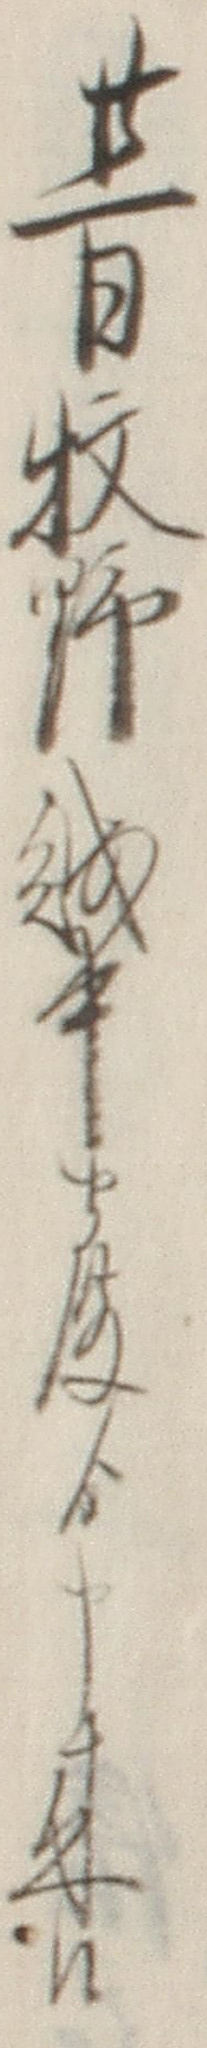廿一日牧野越中守殿ゟ申来候

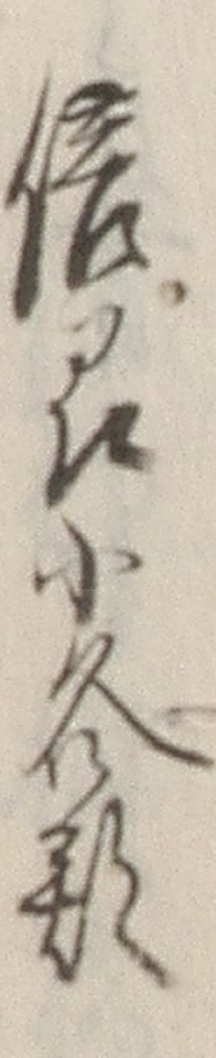濃州小谷郡
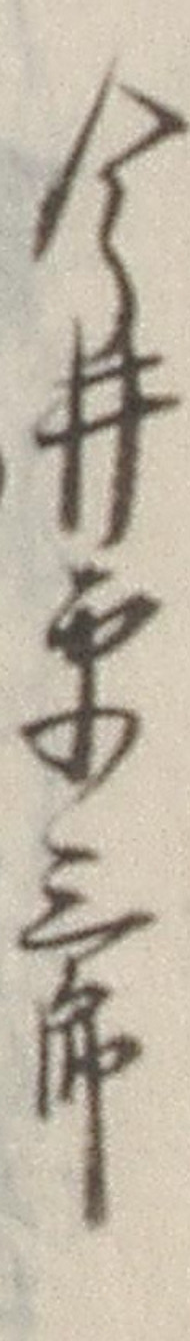今井平三郎
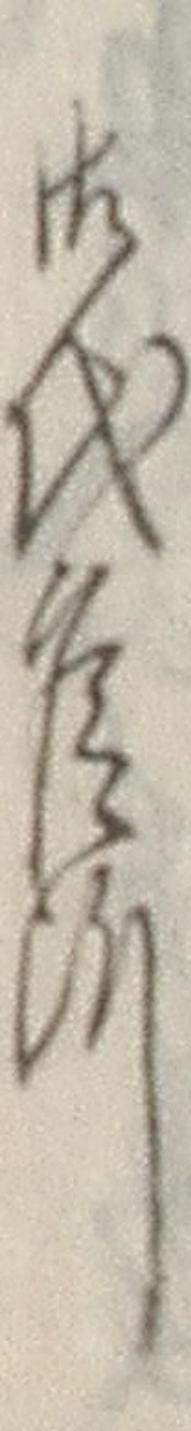御代官所
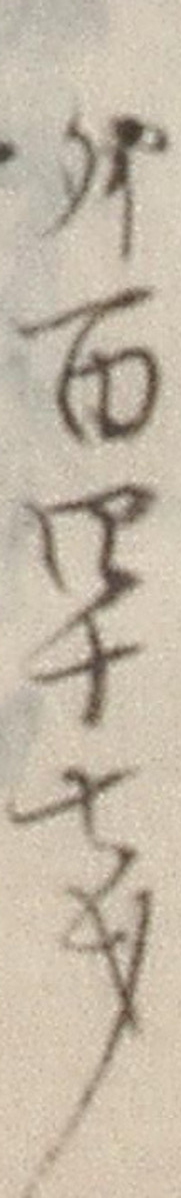卯百四十七才
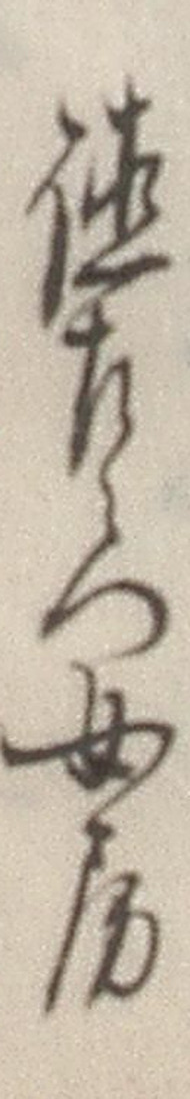徳左衛門女房
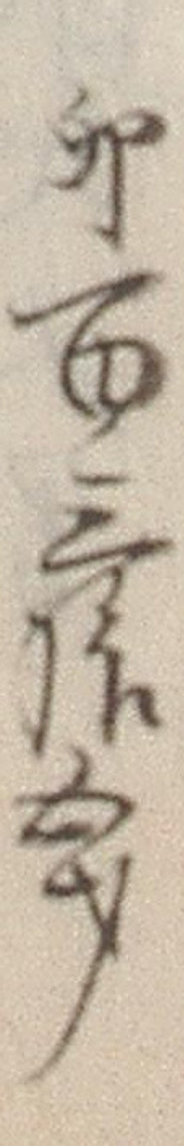卯百三拾五才
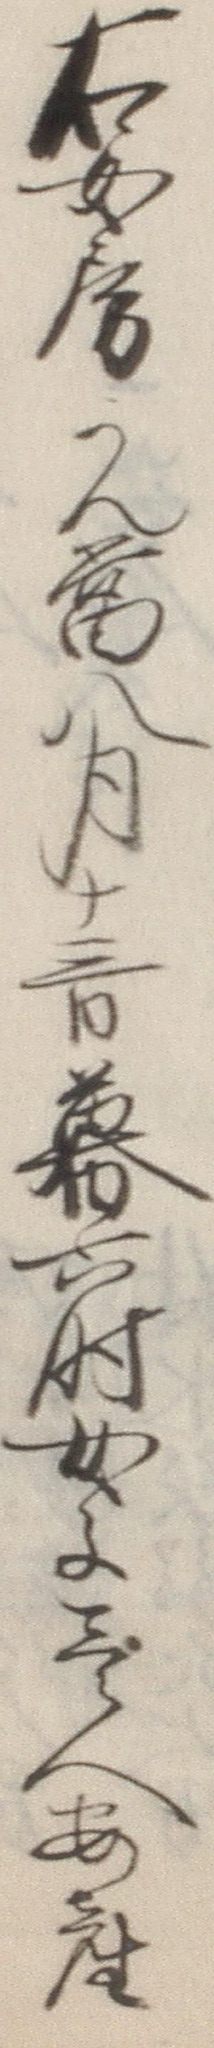右女房かん當八月十三日暮六時女子壱人安産
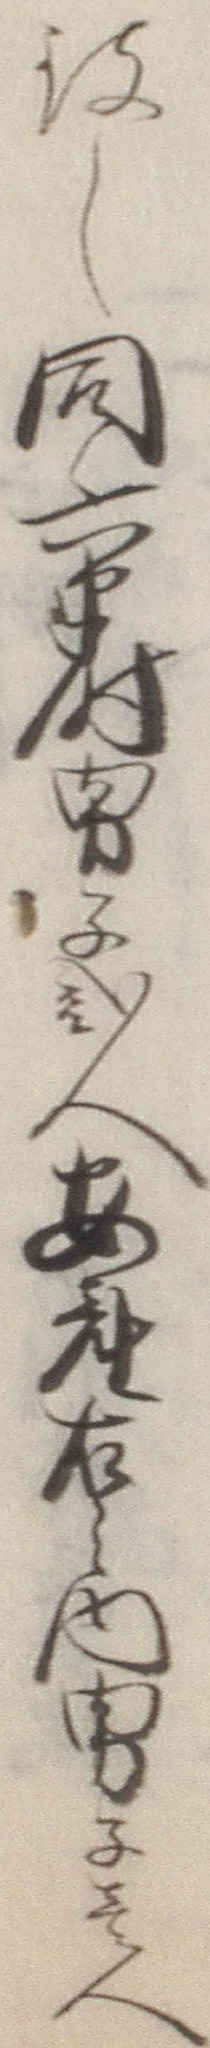致し同六半時男子弐人安産右之内男子壱人
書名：[諸国災害記録]
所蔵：東京大学地震研究所図書室 Earthquake Research Institute Library, The University of Tokyo, JAPAN
